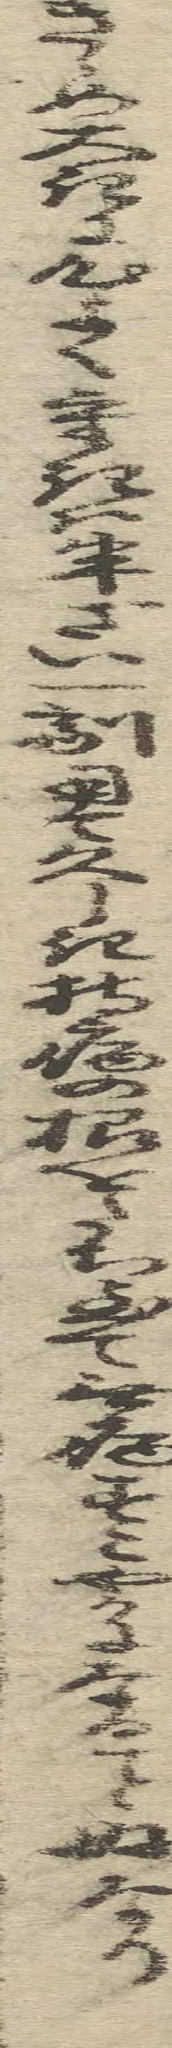きゝめ大きに心よく重きは半ざい一劑用て久しき持病の根をたち至て無病すこやかになること妙なり
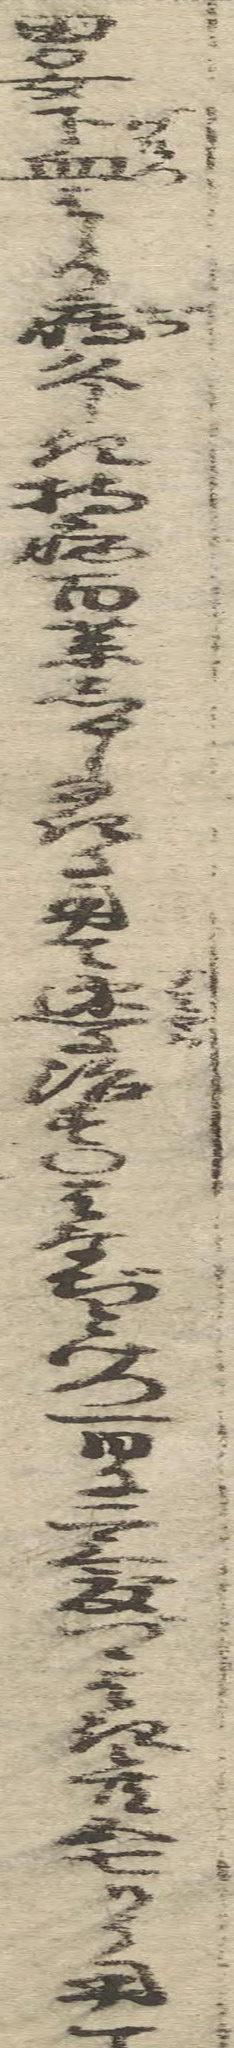男女下血はしり痔久しき持病百薬しるしなきに用て速に治す○はなぢとけつ一日にニ三度づゝはき候共五七りう用て
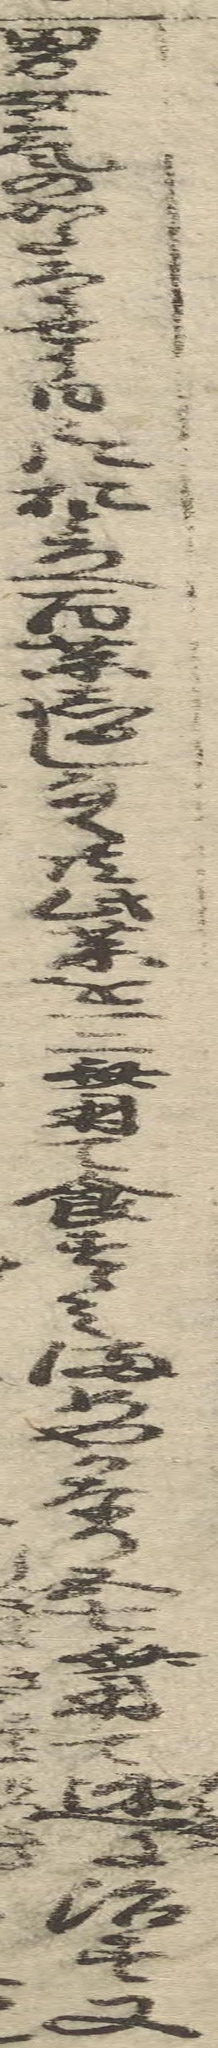男女気のかたろうせう日々におとろへ百薬しるしなく共此薬を一ニ斉用て食すゝみまめやかなり五七斉用て速に治す又
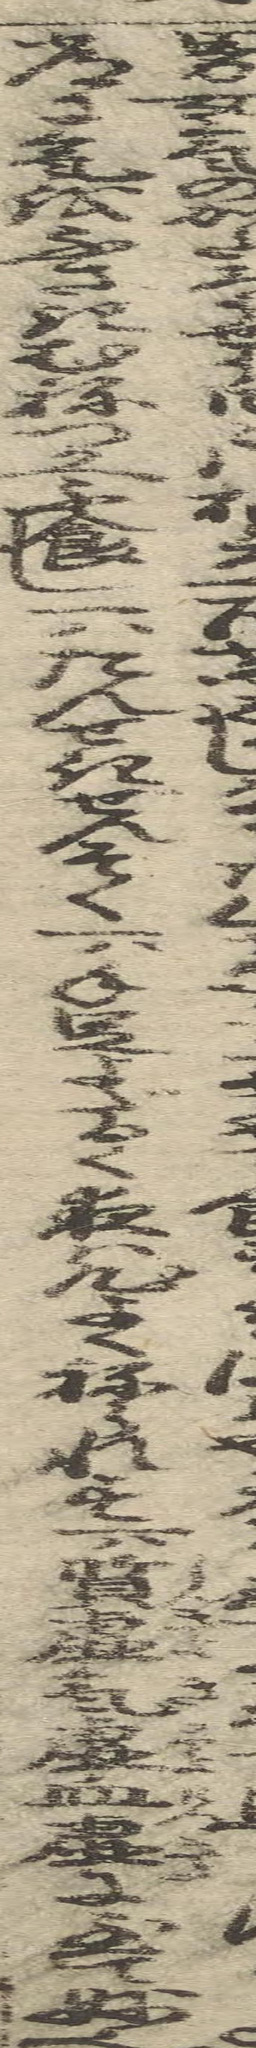常に気をふさきむねつかへ不食し一はたんせきぜんそく一は手足よだるく夜は心よくねられす一は腎虚気虚血虚に至て妙也
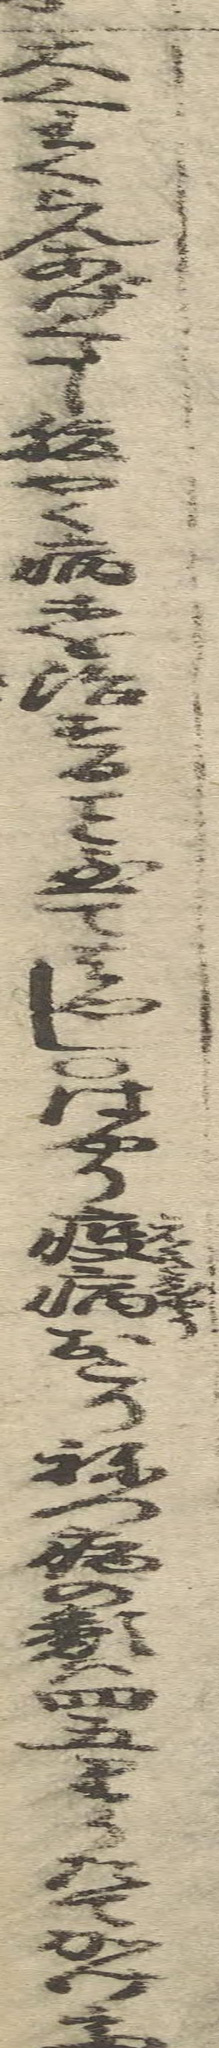大くわくらんあげくたし腹やく病等を治すること至てはやし〇はやり疫病おこりねつ病の類は四五りうたてがけて
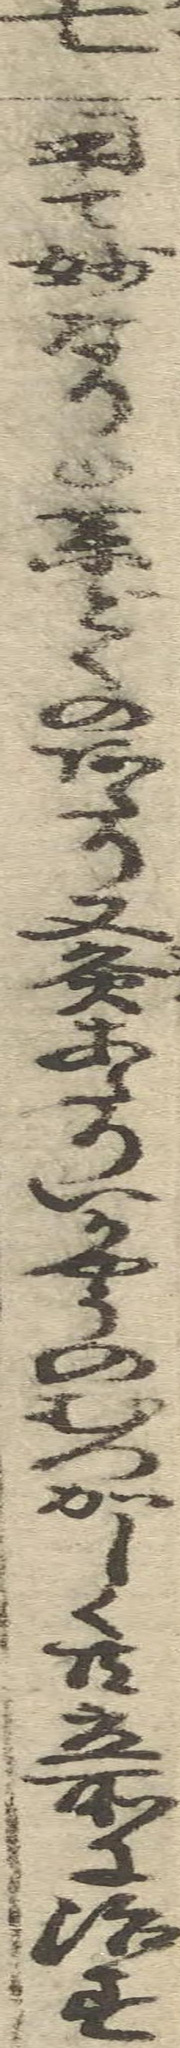用て妙なり〇薬どくのあたり又灸あたりいかやうのむつかしく共立所に治す
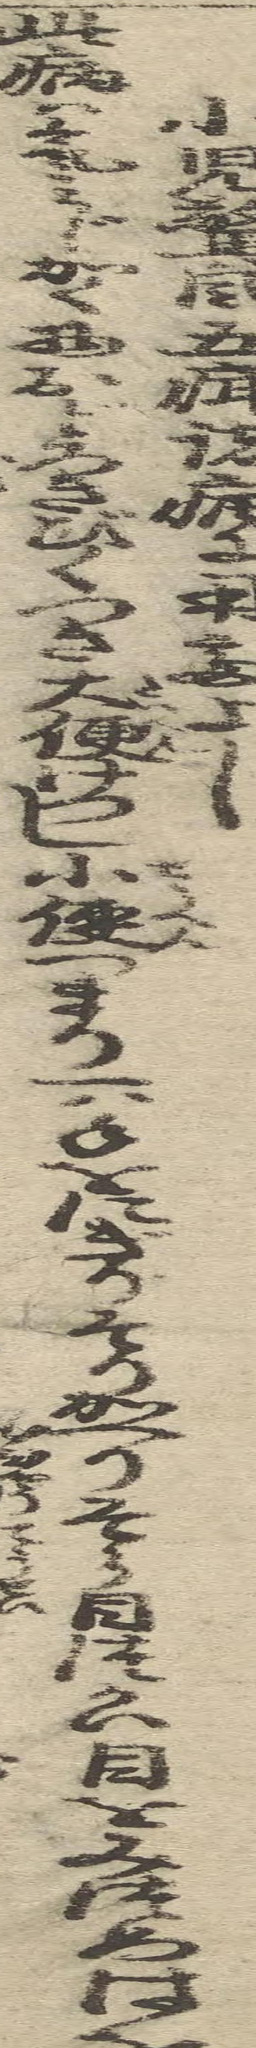此病は気みじかく物おどろきびくつき大便けつし小便つまり一は手をにぎりそりかへりそら目つかい目をみつめはを
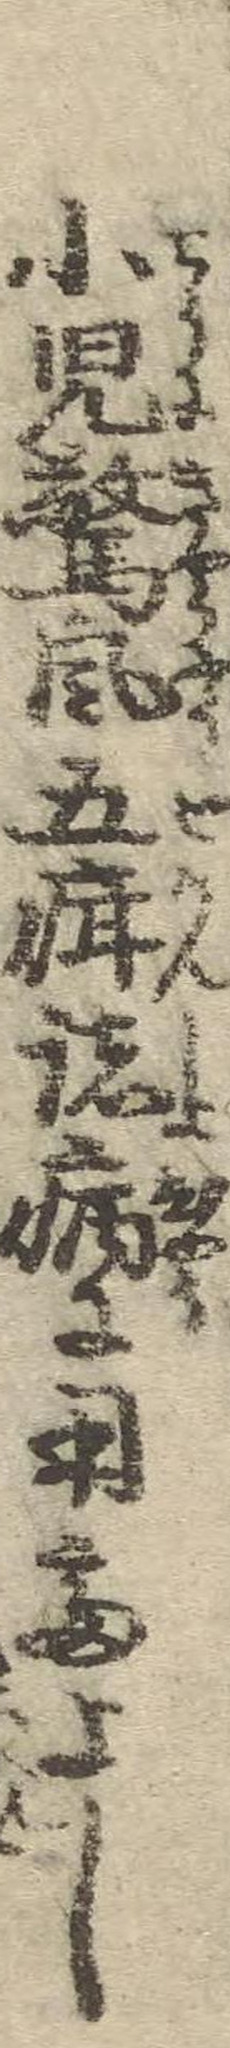小児驚風五疳諸病に用てよし
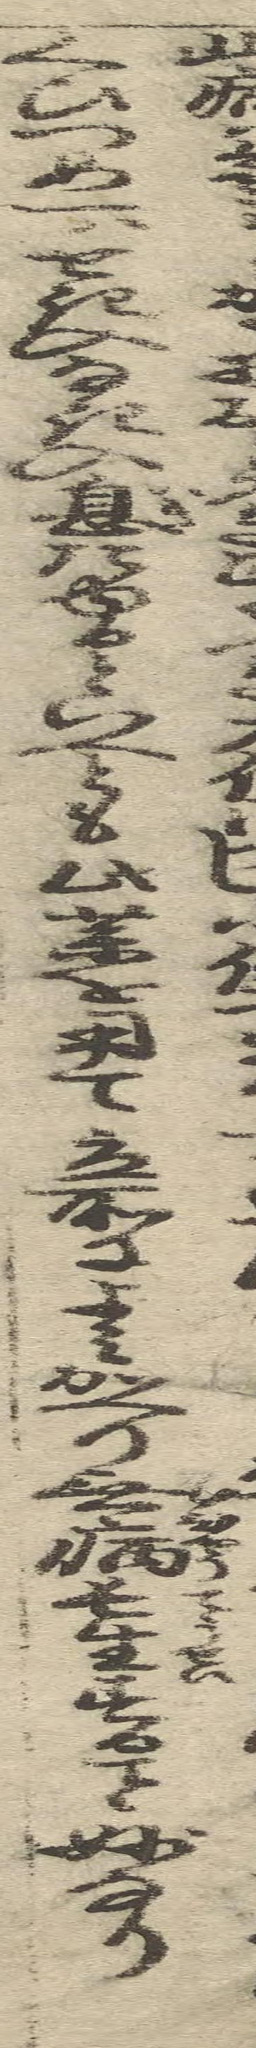くひつめ一はせき入なき入息たゆるといへとも此薬を用て立所によみかへり無病長生すること妙なり
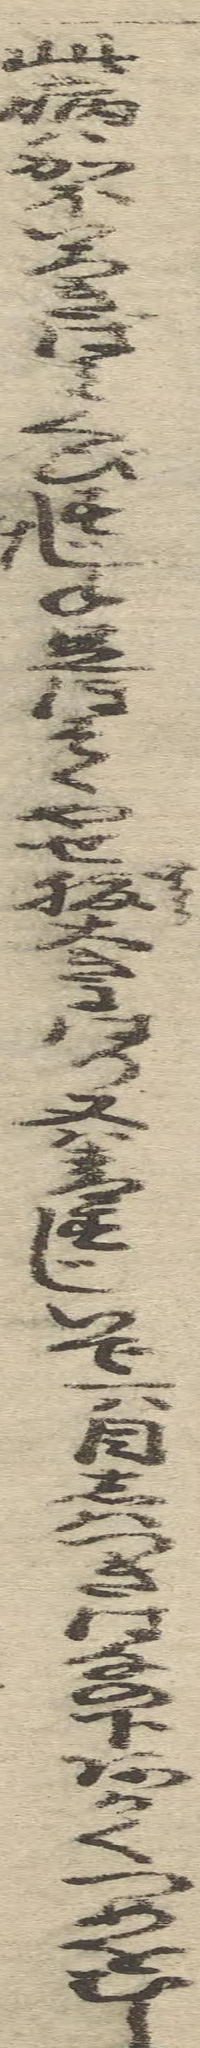此病はかほいろきばみくびすじ手足ほそくやせ腹大きにはり又は青すじいで一は目しはつきはなの下あかくつめをむしり
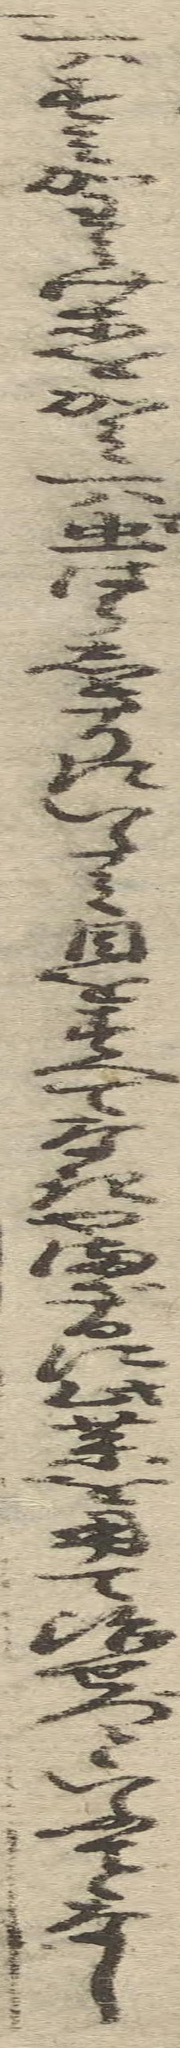一はすみかわらけ等をかみ一は虫はらしきりにいたみ目をすへてなきやまざるに此薬を用て治せづといふことなし
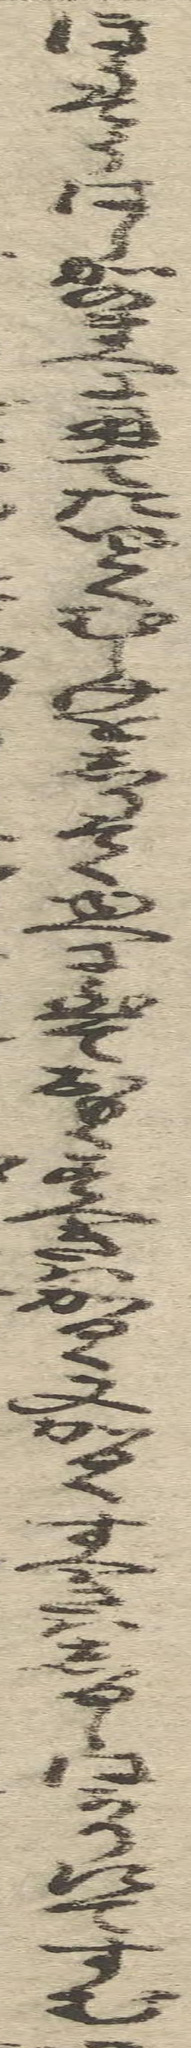ほうそうはしかのまへに用てたいどくむしけをしりそくゆへに至ておもくすへきはかるく又かるくすへきはしるしはかりにてすむ又
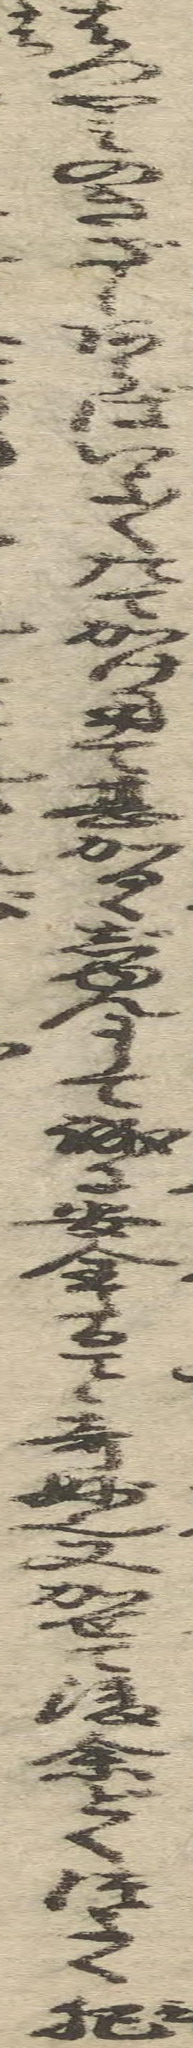はつやみのきざしあらばいよ〳〵たてかけ用て甚かるくじゆんにして誠に安全たること奇妙也又かせて後余どくつよく肥
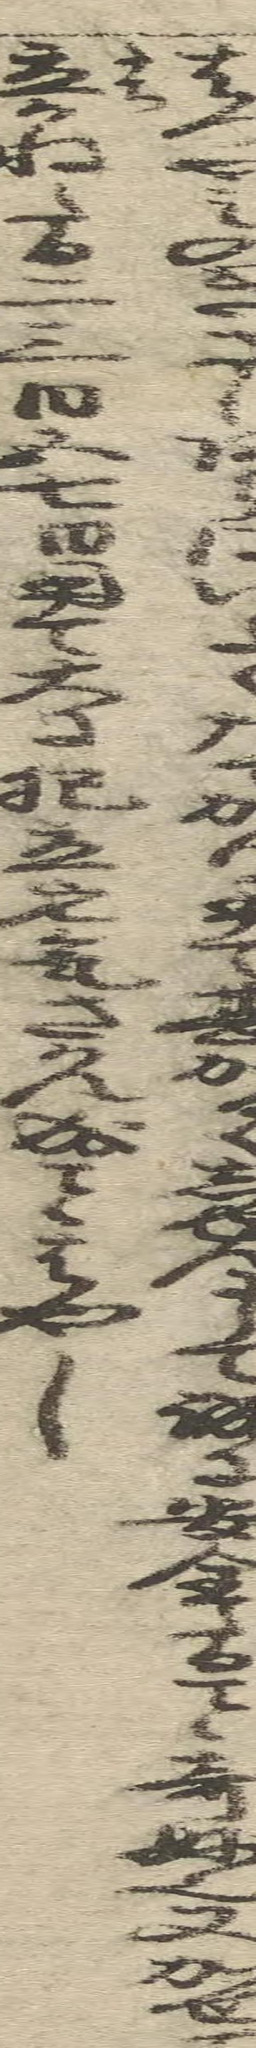立かねたる二三日五七日用て大に肥立元気さかん成ことはやし
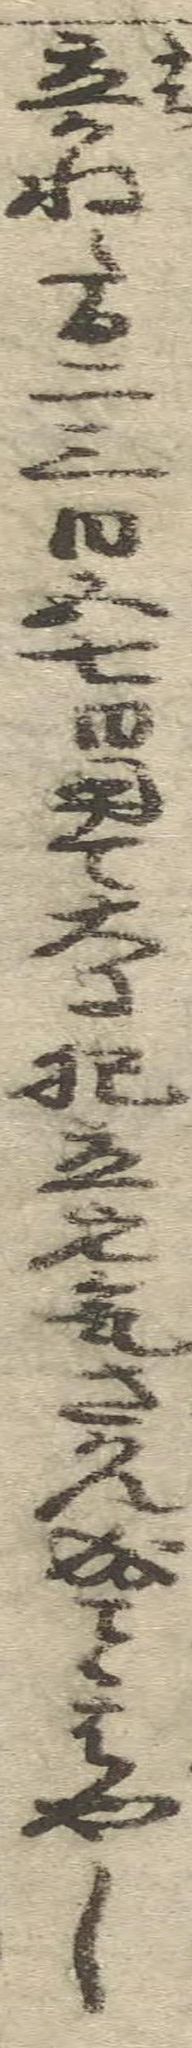立かねたる二三日五七日用て大に肥立元気さかん成ことはやし
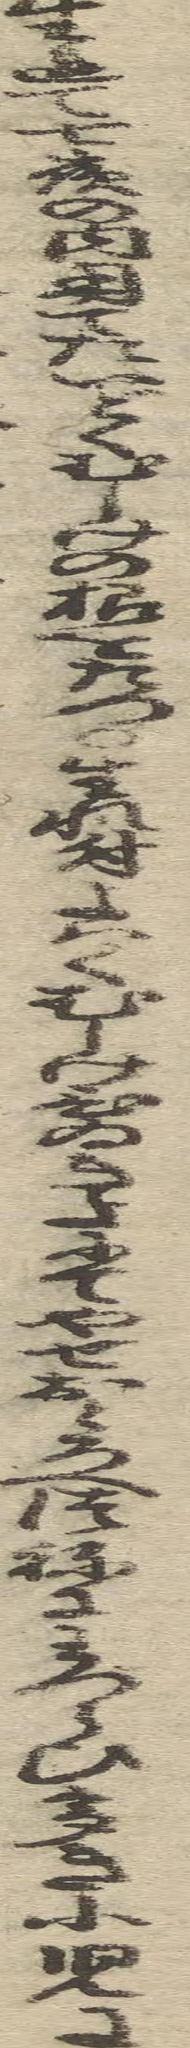生れて七夜の内用てたいどくむしけの根をたつ〇生れ付よはくむしけひゐきよにてやせおとろへつねにわづらひ多き小児に
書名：浪華薬種問屋能書張交帖. 二
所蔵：国立国会図書館 National Diet Library, JAPAN
